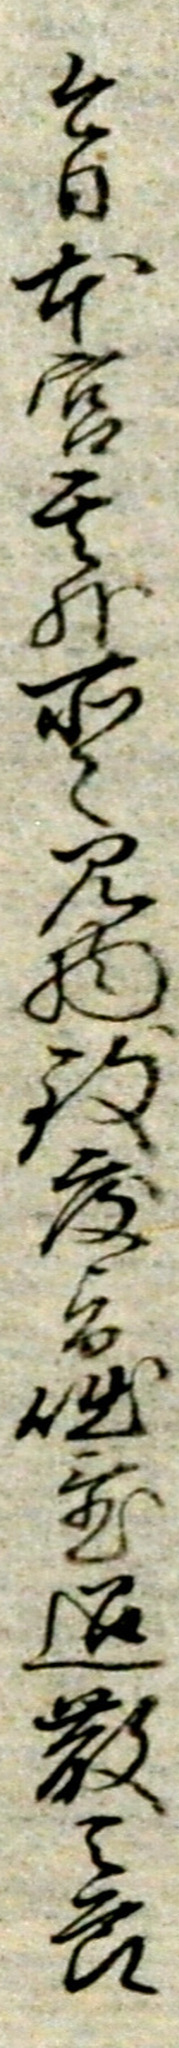今日本宮其外所々見物致度旨咄置退散之節
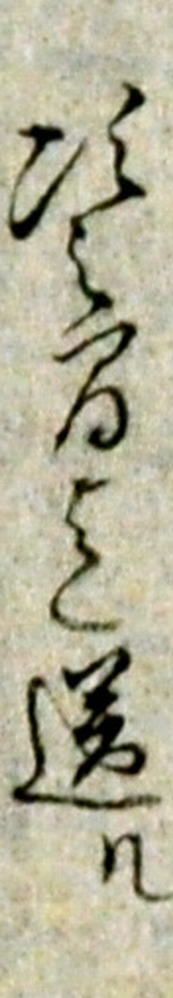次之間迄送
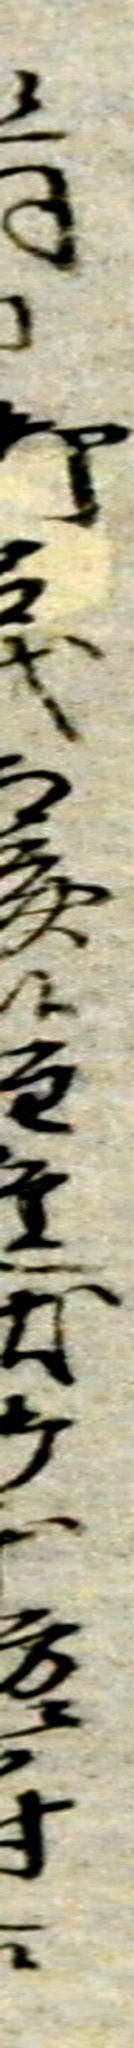但明日御名代相済候注進状御本坊ニ而封し候

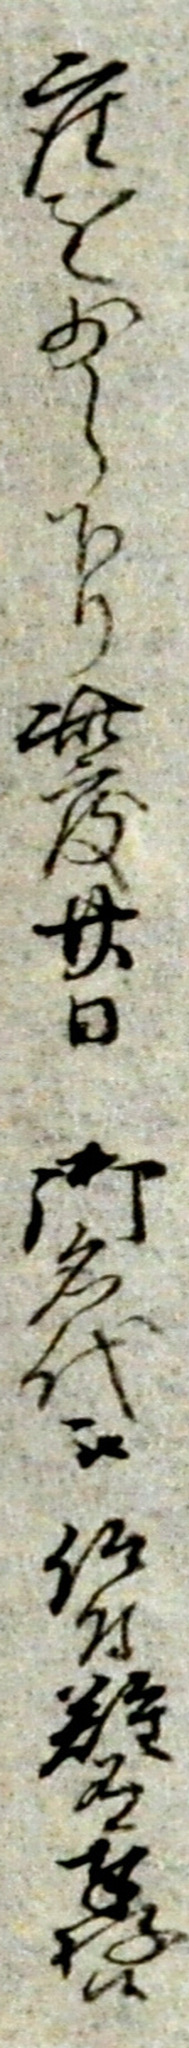座を少し下ㇼ此度廿日御名代被仰付難有
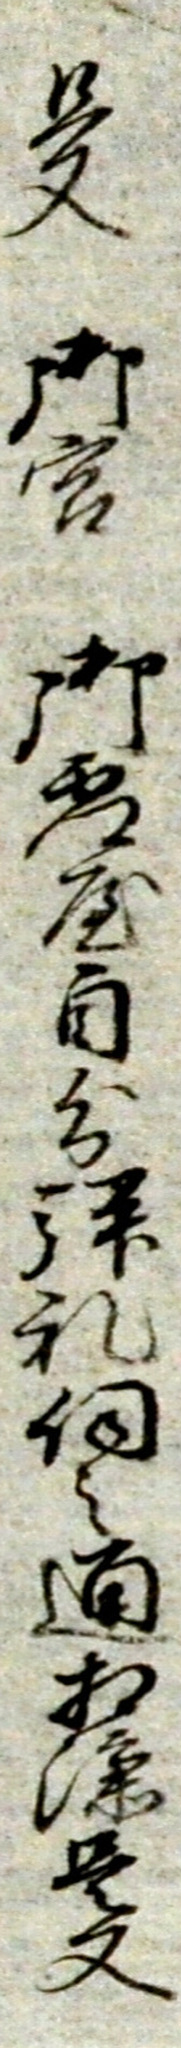且又御宮御霊屋自分拝礼伺之通相済是又
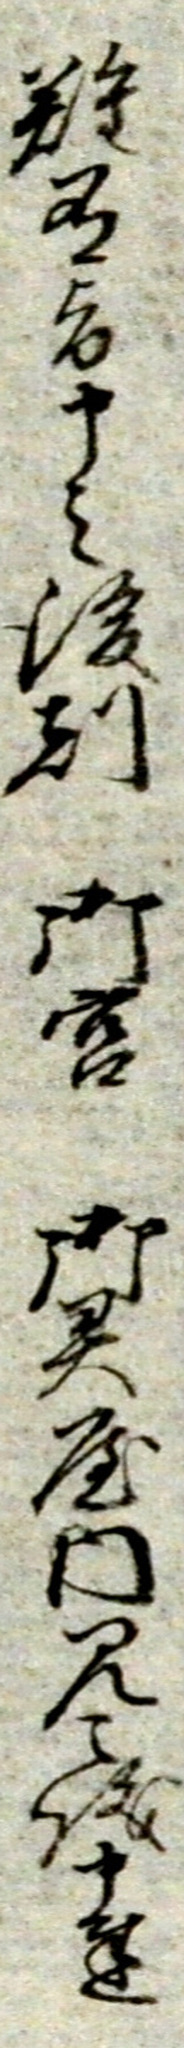難有旨申之後刻御宮御霊屋内見之儀申達奉存候
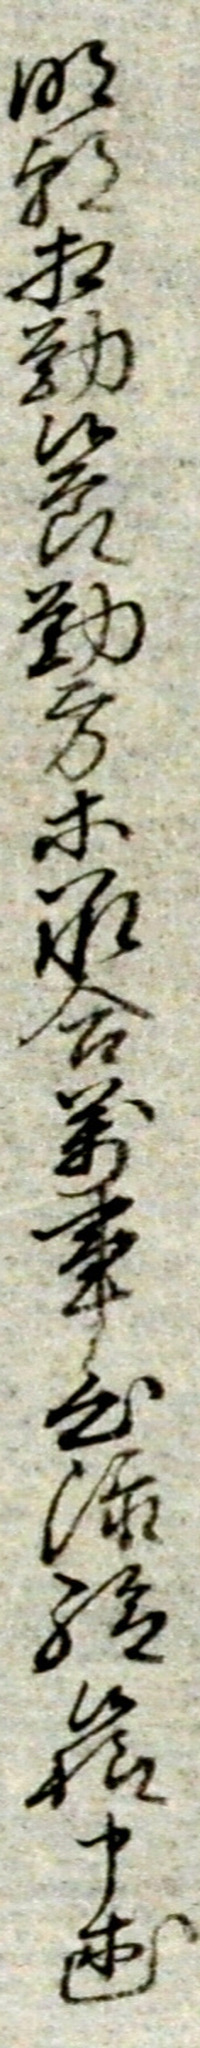明朝相勤候節勤方等承合万事心添給候様申述
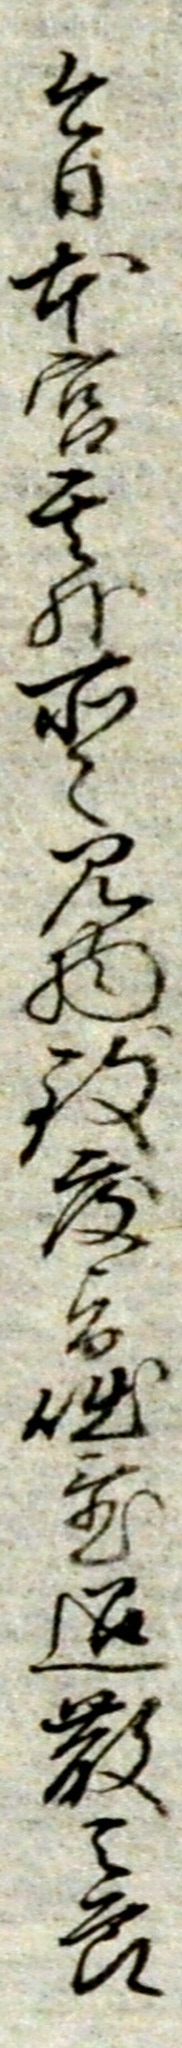今日本宮其外所々見物致度旨咄置退散之節
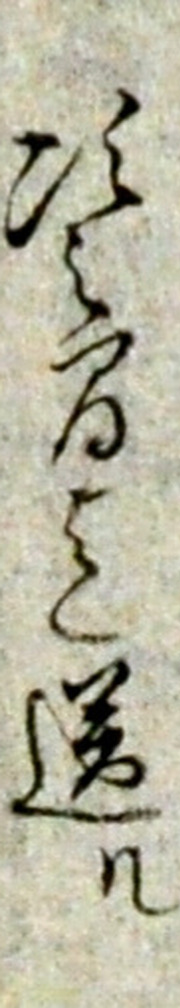次之間迄送ル
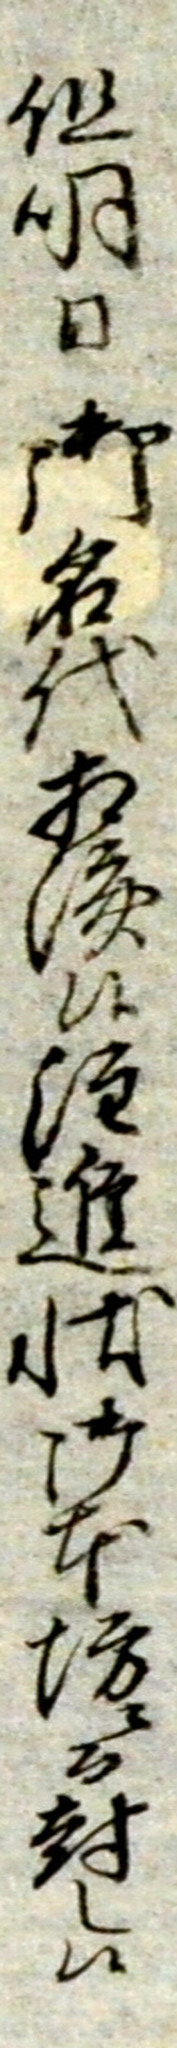但明日御名代相済候注進状御本坊ニ而封し候
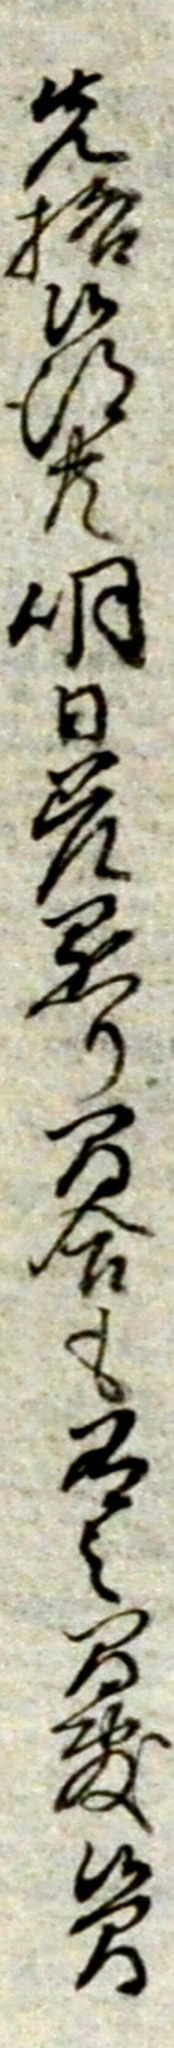先格候得共明日差懸り間合も有之間敷候間
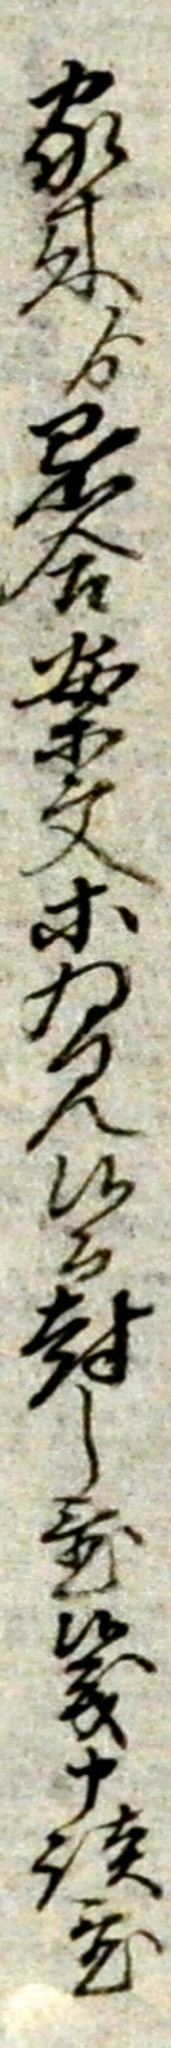家来ゟ懸合案文等為見候而封し置候義申談置
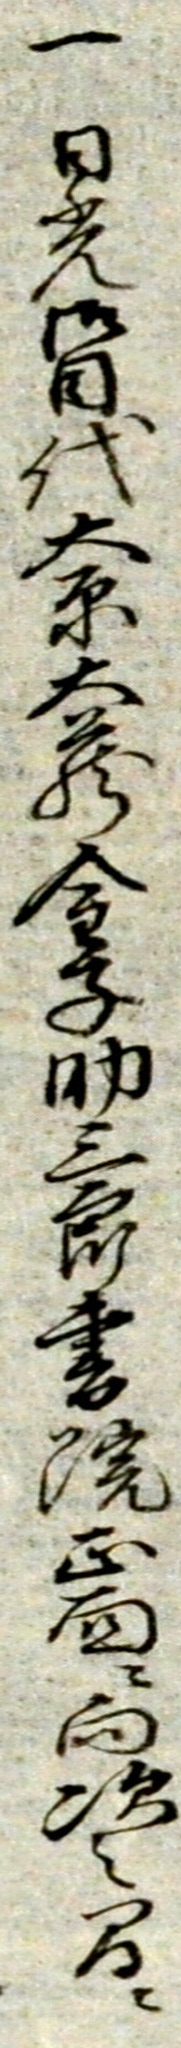一日光御目代大原大蔵金子助三郎書院正面ニ向次之間ニ
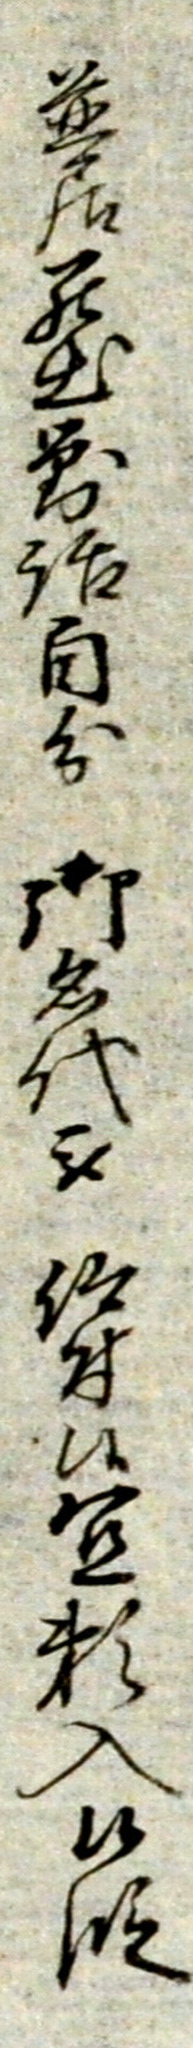並居罷出対話自分御名代被仰付候宜頼入候段
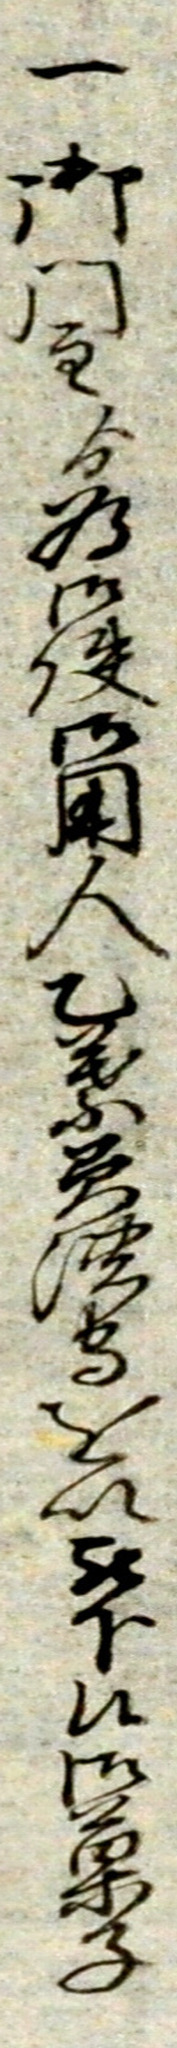一御門主ゟ為御使御用人乙葉美濃守を以被下候御菓子
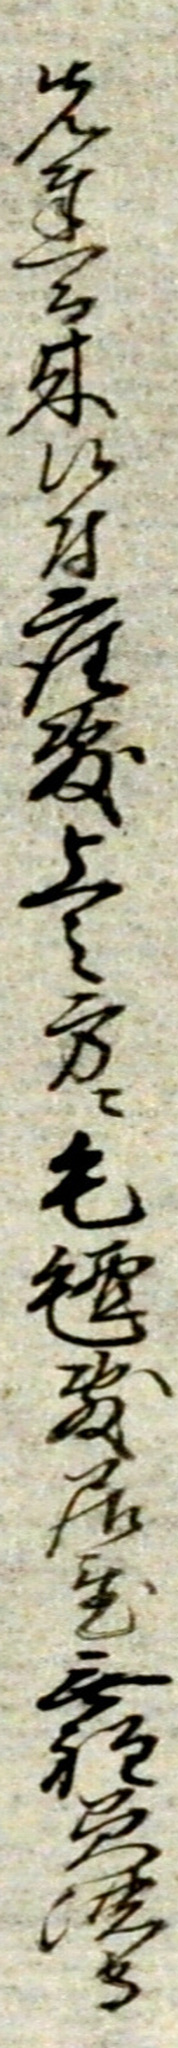先達而来候付座敷上之方ニ毛氈敷居置無程美濃守
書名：日光御名代相勤候節ノ留
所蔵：伊那市立高遠町図書館・合同会社AMANE
